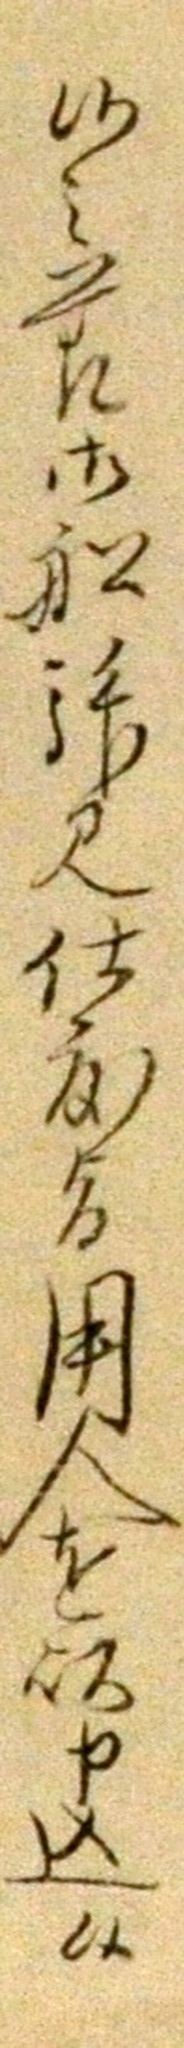候之節御船拝見仕度旨用人を以申込候
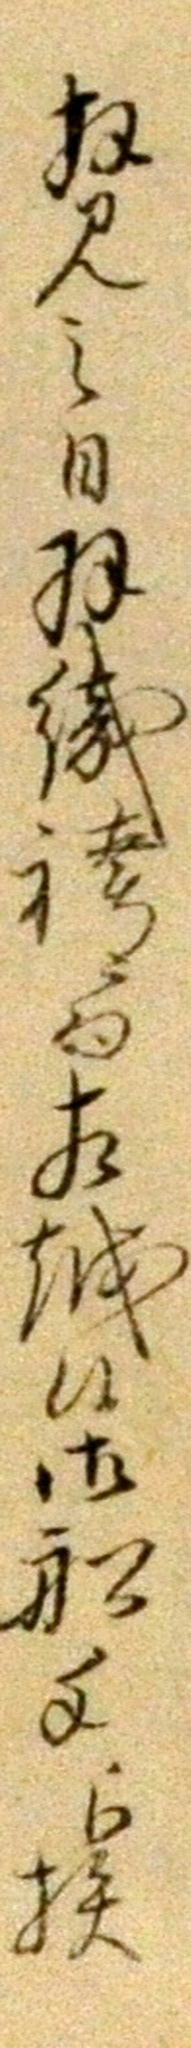拝見之日羽織袴ニ而相越候御船手え挨
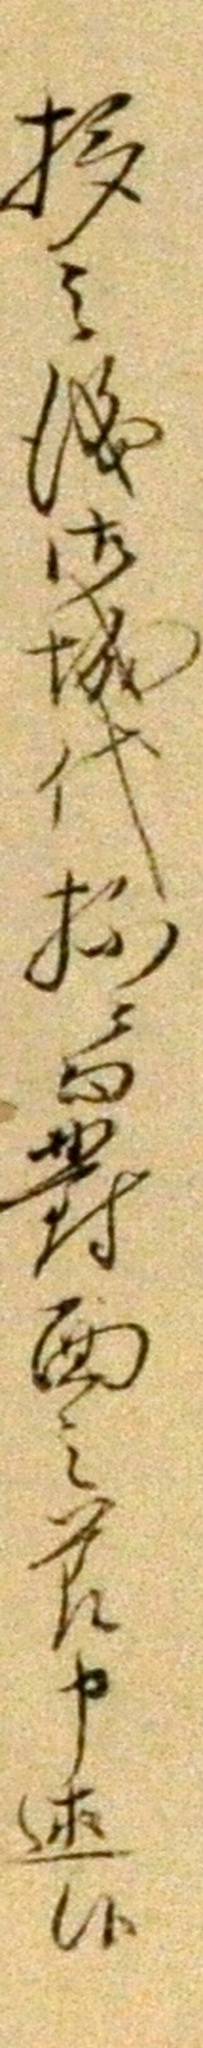拶之儀御城代抔ニ而対面之節申述候
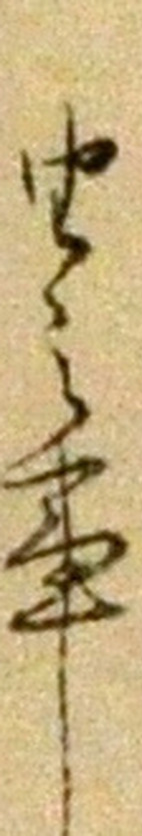由之事
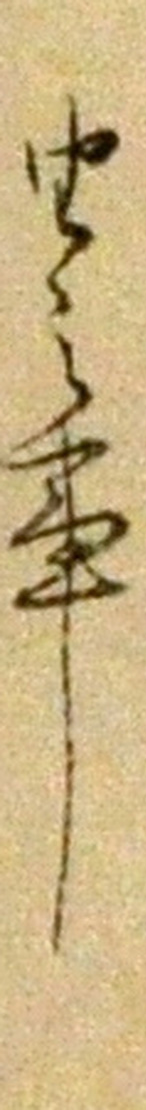由之事
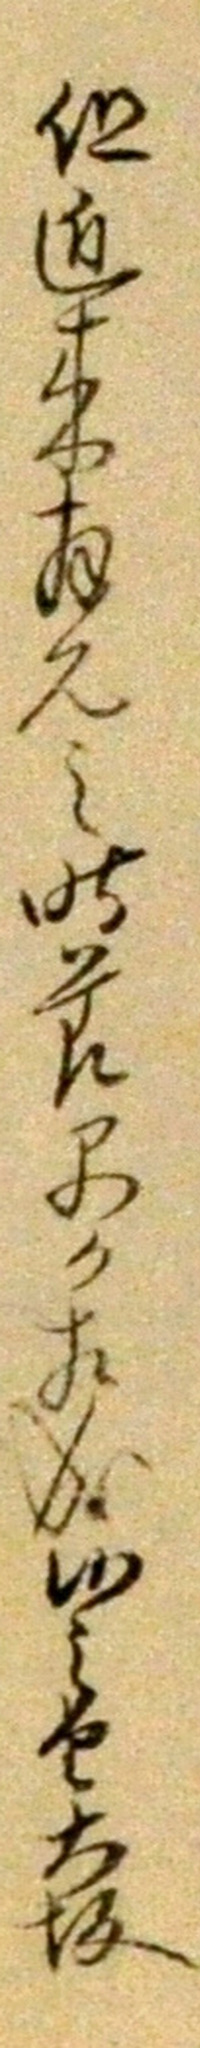但近来拝見之時節早ク相成候之由大坂
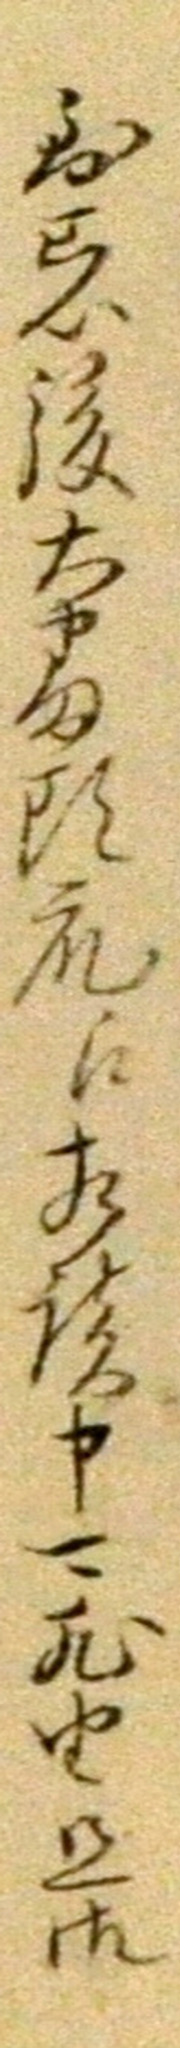到着後大番頭衆え相談申可然由且御

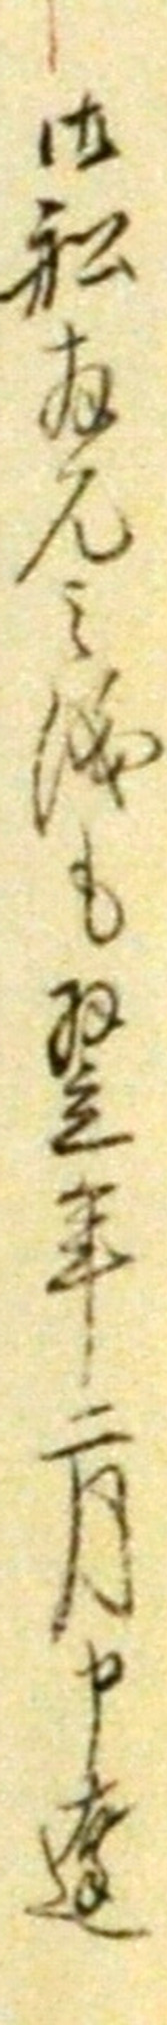御船拝見之儀も翌年二月申達
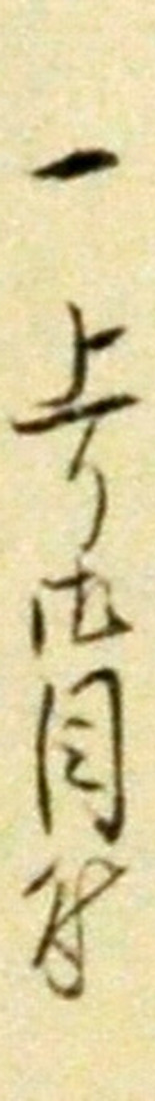一上り御目付
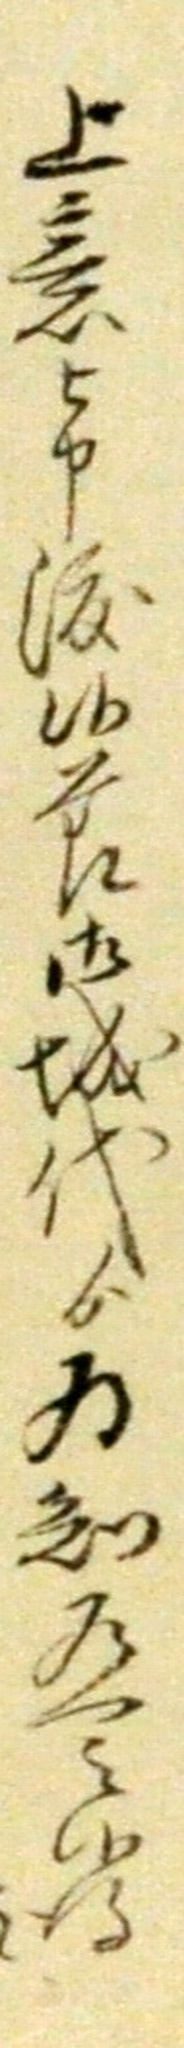上意被申渡候節御城代ゟ為知有之候得者
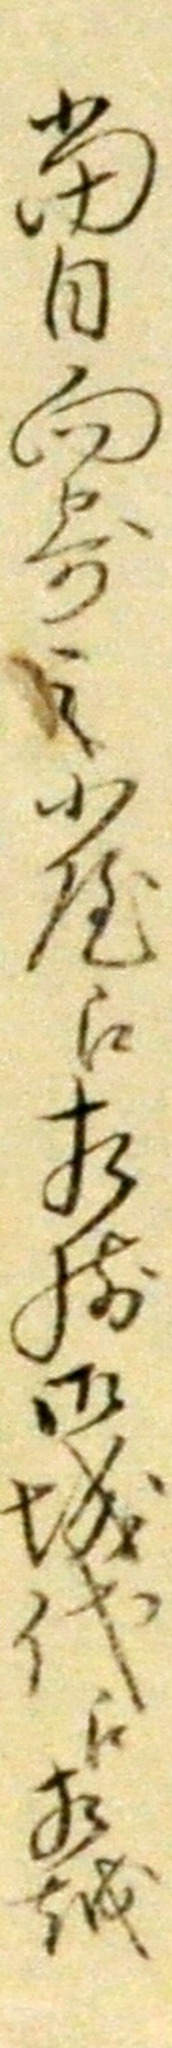当日向寄之小屋え相揃御城代え相越
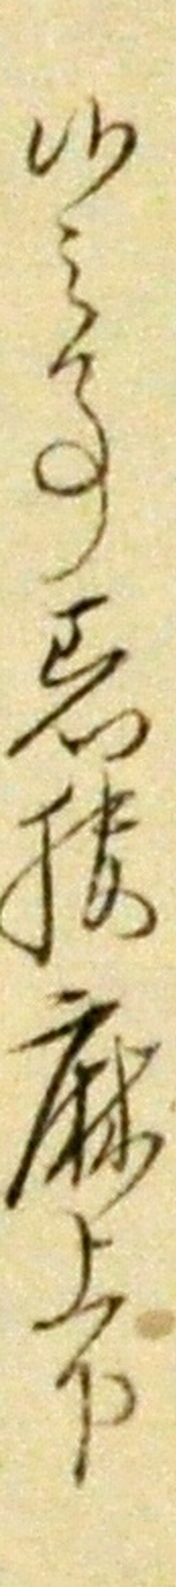候之事着服麻上下
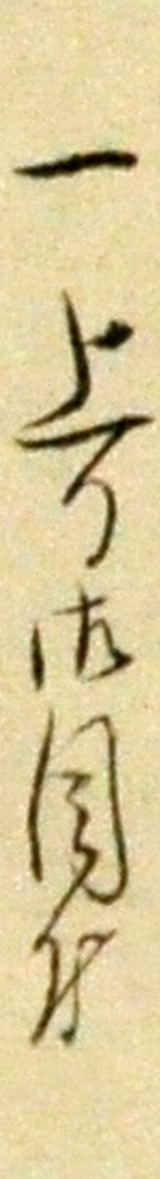一上り御目付
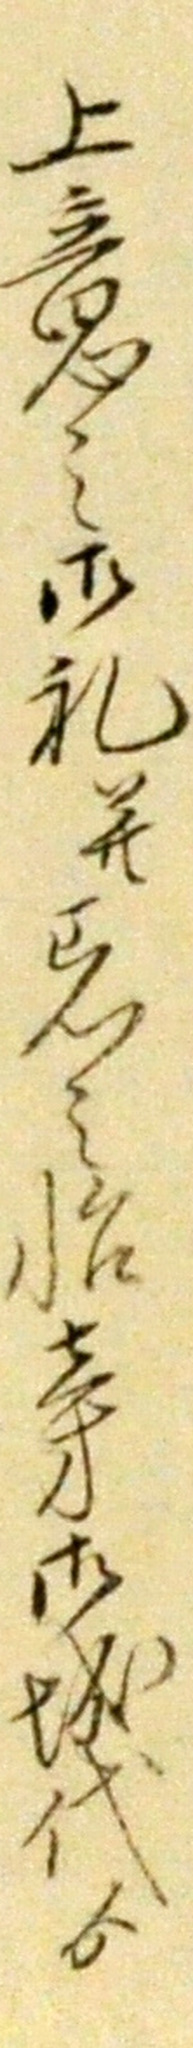上意之御礼并着之怡旁御城代ゟ
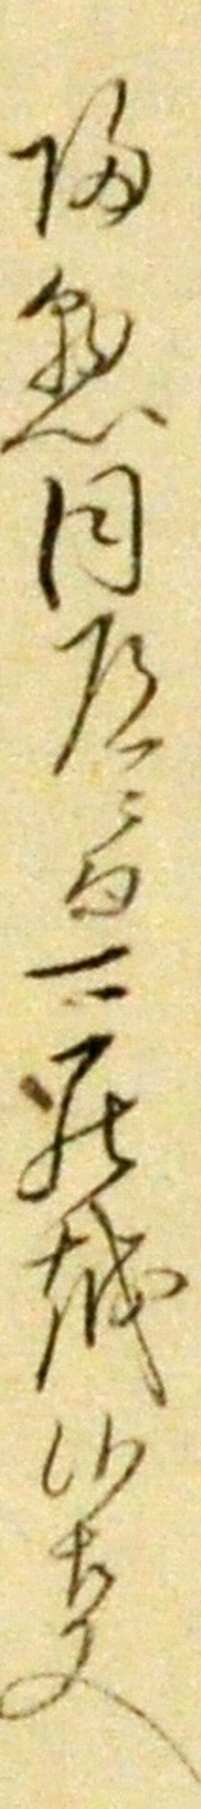帰懸同道ニ而可罷越候事
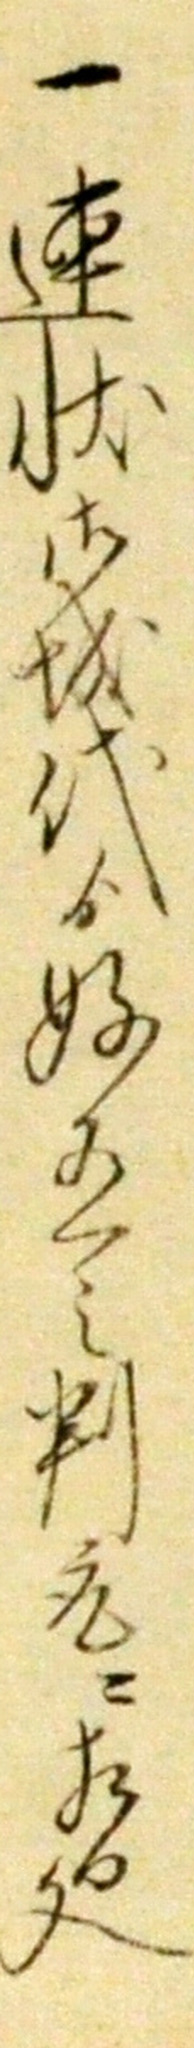一連状御城代ゟ好有之判取ニ相廻
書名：大阪加番関係諸書留〔一括〕
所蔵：伊那市立高遠町図書館・合同会社AMANE
